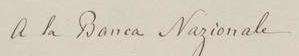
A la Banca Nazionale
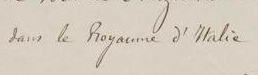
dans le Royaume d'Italie
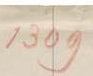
Berne
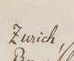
Zurich
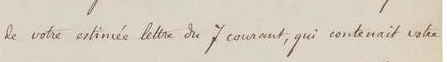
de votre estimée lettre du 7 courant, qui contenait votre
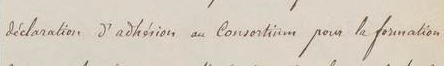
déclaration d'adhésion au Consortium pour la formation
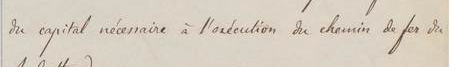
du capital nécessaire à l'exécution du chemin de fer du
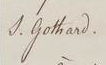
S. Gothard.
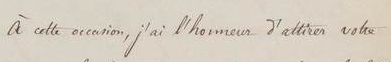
À cette occasion, j'ai l'honneur d'attirer votre
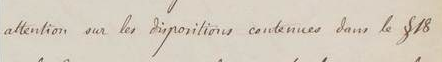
attention sur les dispositions contenues dans le § 18
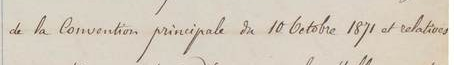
de la Convention principale du 10 Octobre 1871 et relatives
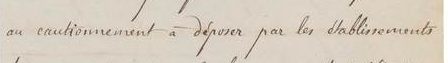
au cautionnement à déposer par les établissements
